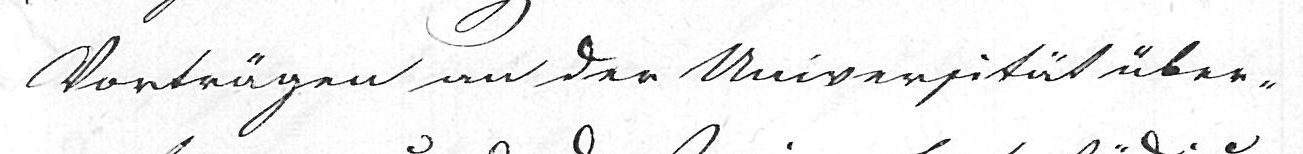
Vorträge an der Universität über-
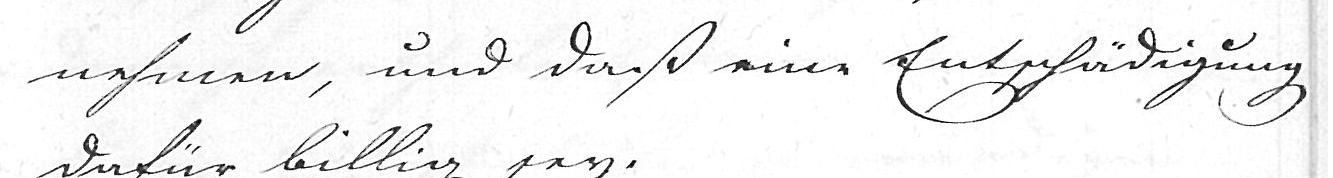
nehmen, und daß eine Entschädigung
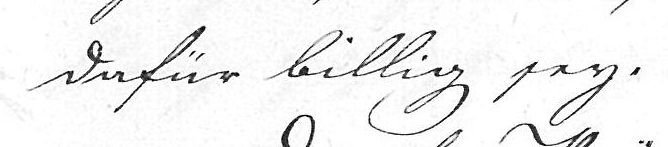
dafür billig sey.
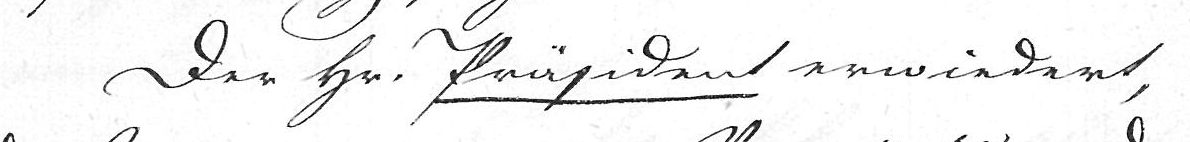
Der Hr. Präsident erwidert,
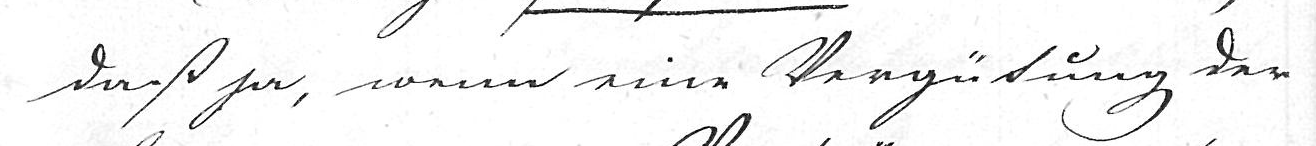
daß ja, wenn eine Vergütung der
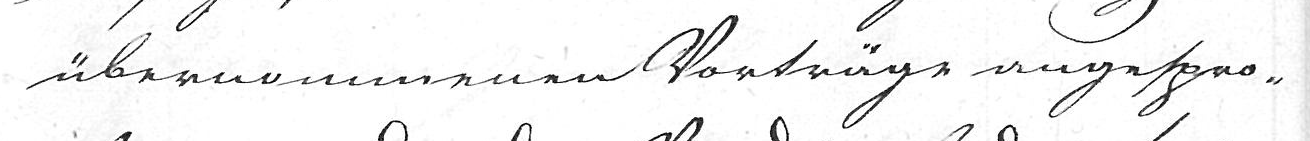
übernommenen Vorträge angespro-
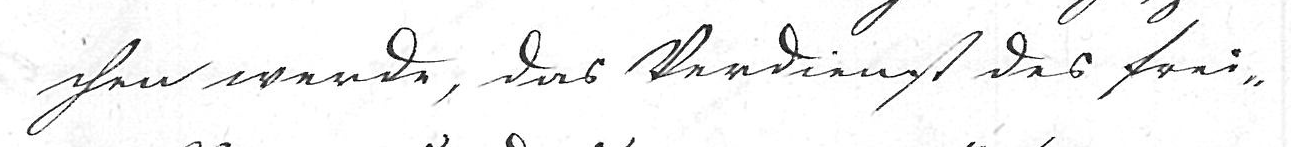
chen werde, das Verdienst des frei-
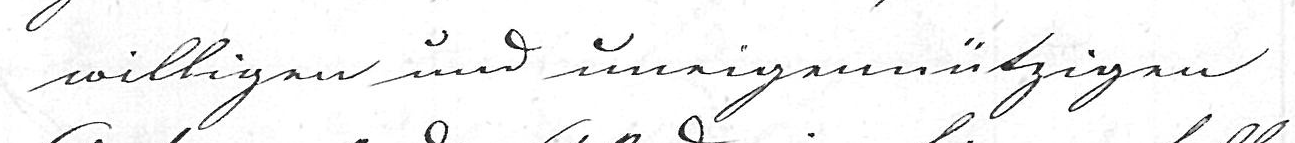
willigen und uneigennützigen
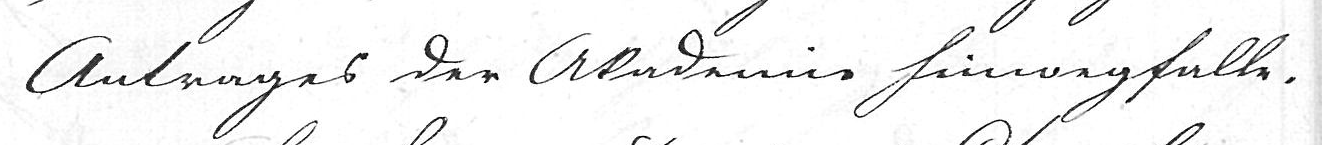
Antrages der Akademie hinwegfalle.
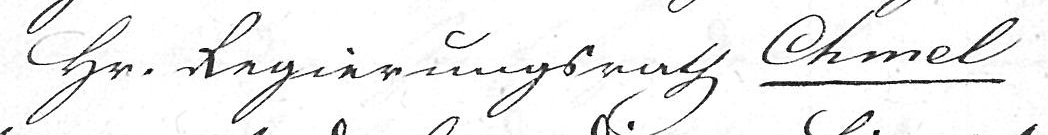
Hr. Regierungsrath Chmel
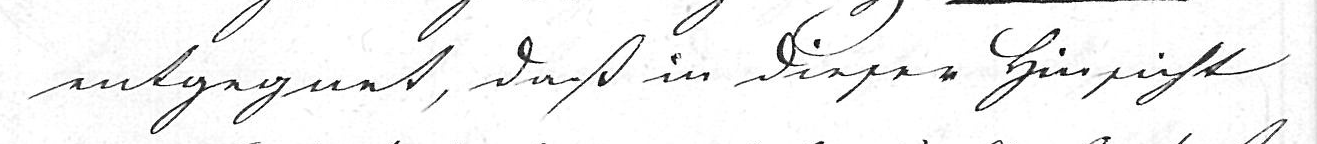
entgegnet, daß in dieser Hinsicht
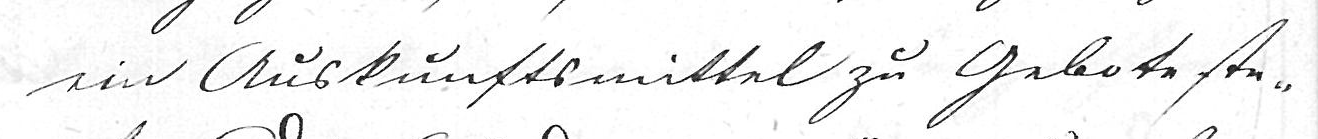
ein Auskunftsmittel zu Gebote ste-
